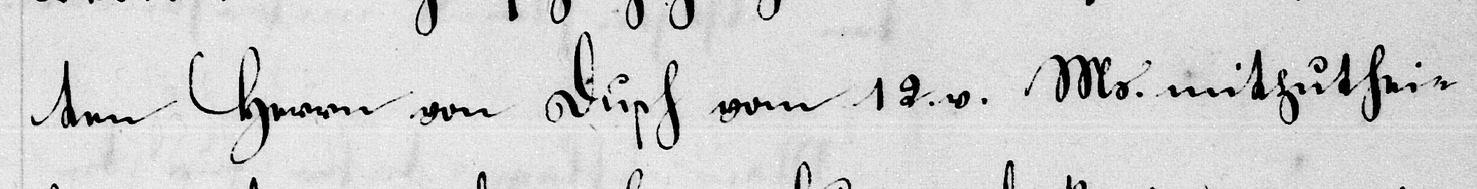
ten Herrn von Dusch vom 12. v Ms. mitzuthei¬
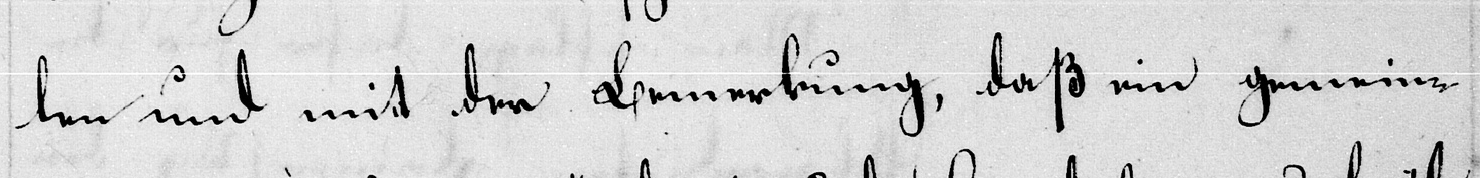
len und mit der Bemerkung, daß ein gemein¬
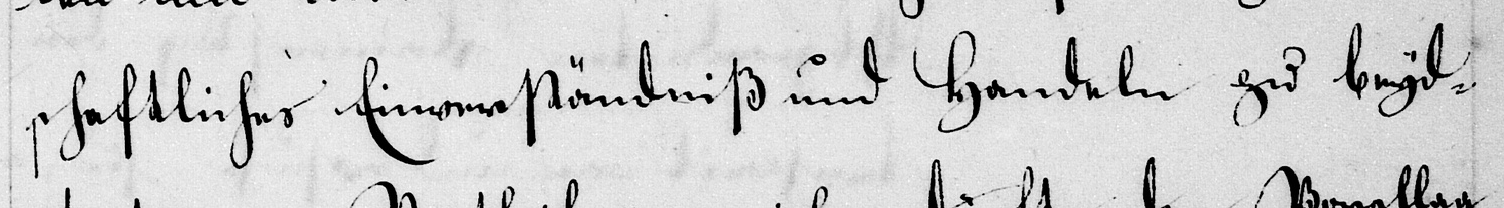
schaftliches Einverständniß und Handeln zu beyd¬
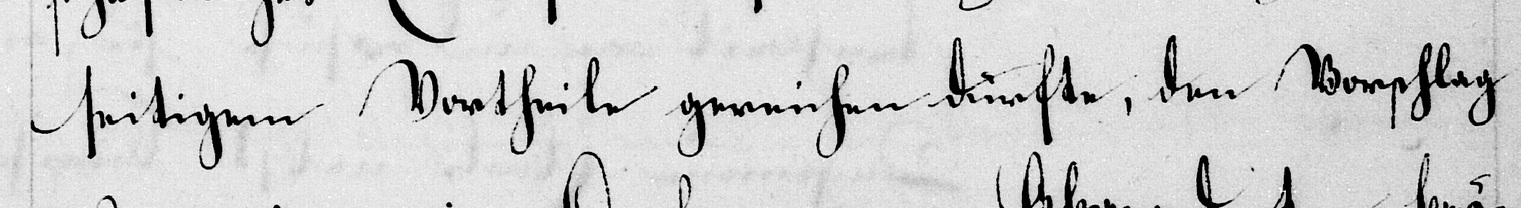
seitigem Vortheile gereichen dürfte, den Vorschlag
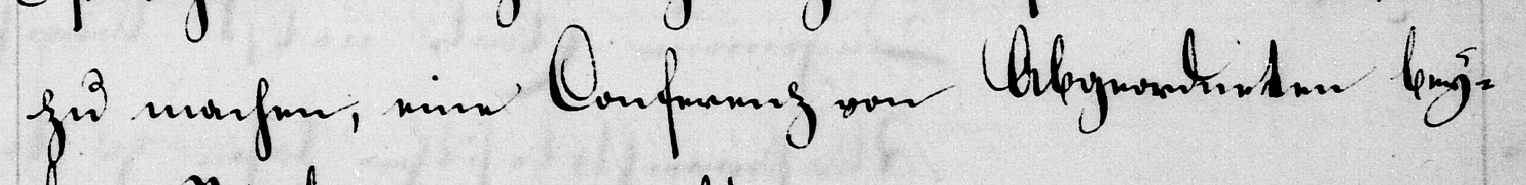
zu machen, eine Conferenz von Abgeordneten bey¬
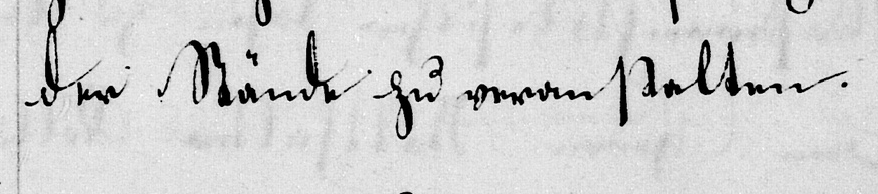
der Stände zu veranstalten.
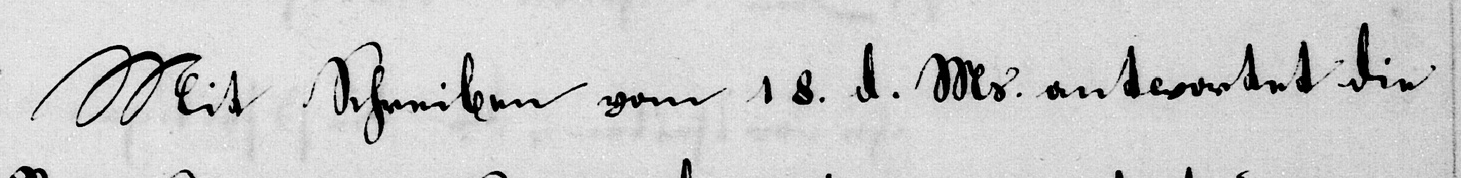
Mit Schreiben vom 18. d. Ms. antwortet die
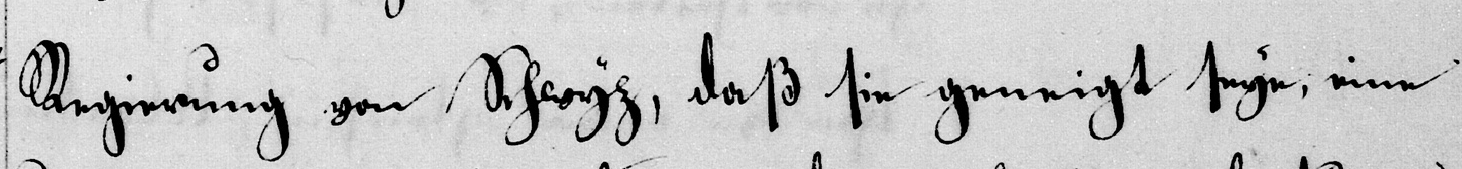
Regierung von Schwyz, daß sie geneigt seye, eine
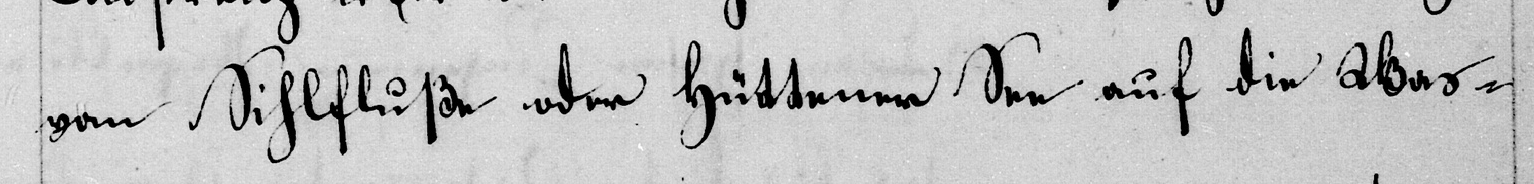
vom Sihlfluße oder Hüttener See auf die Was-
